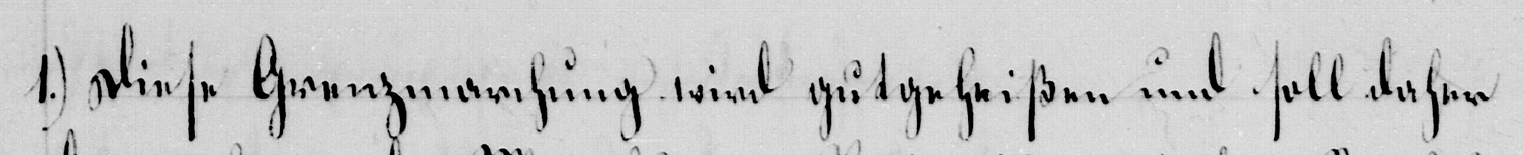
1.) Diese Grenzmarchung wird gutgeheißen und soll daher
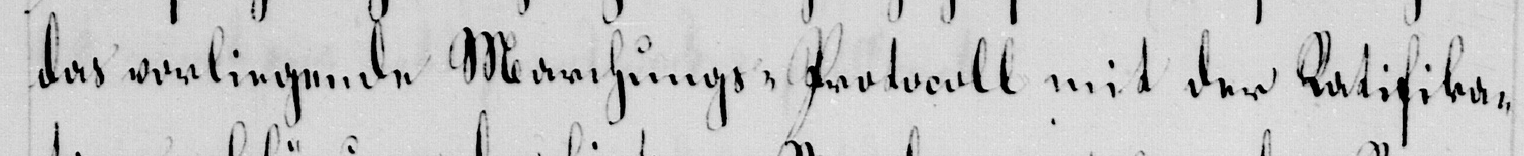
das vorliegende Marchungs-Protocoll mit der Ratifica¬
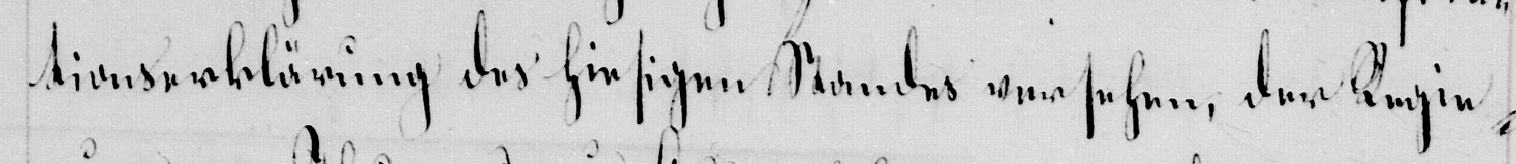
tionserklärung des hiesigen Standes versehen, der Regie¬
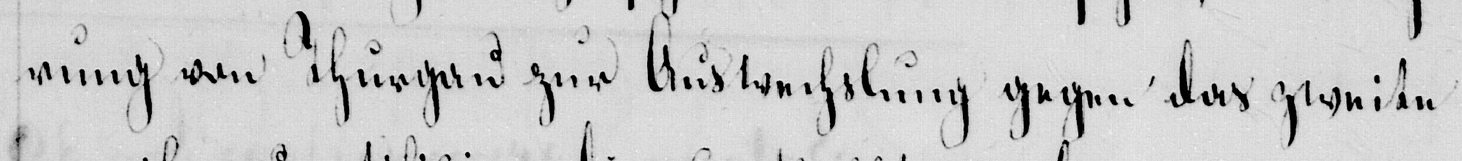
rung von Thurgau zur Auswechslung gegen das zweite
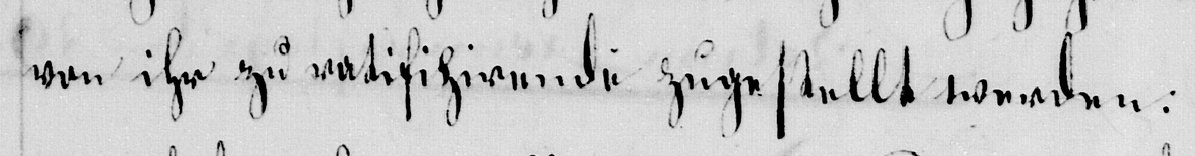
von ihr zu ratificirende zugestellt werden.
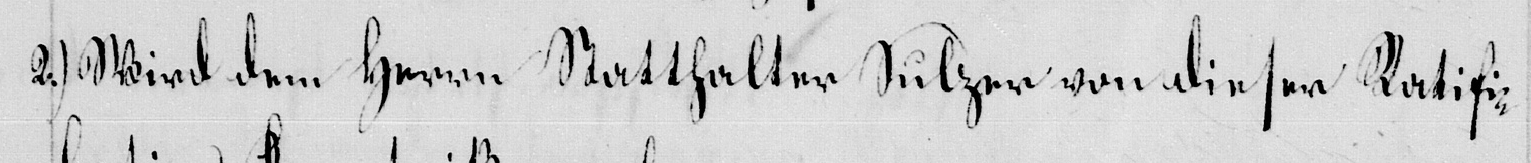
2.) Wird dem Herrn Statthatler Sulzer von dieser Ratifi¬
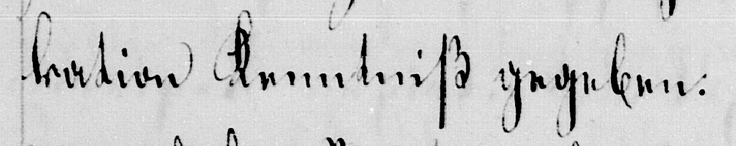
cation Kenntniß gegeben.
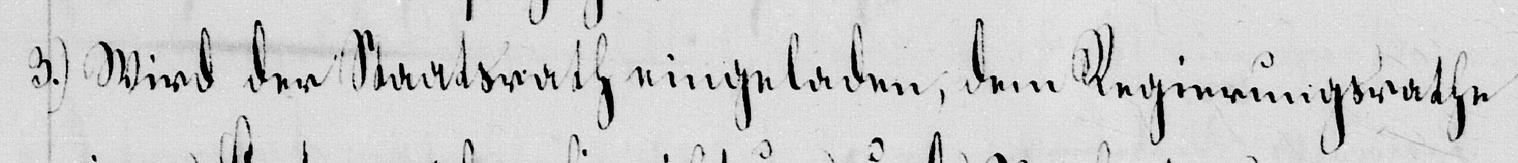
3.) Wird der Staatsrath eingeladen, dem Regierungsrathe
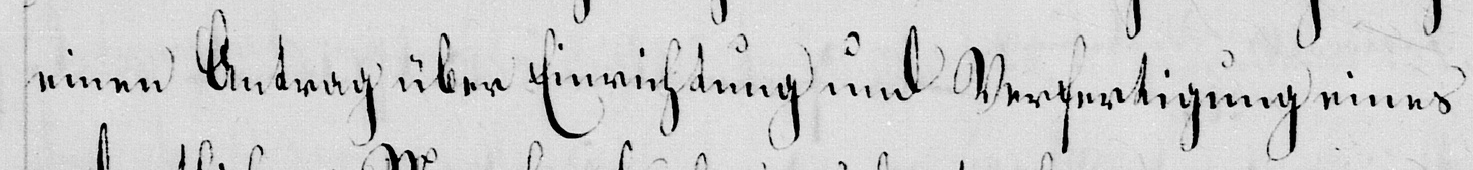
einen Antrag über Einrichtung und Verfertigung eines
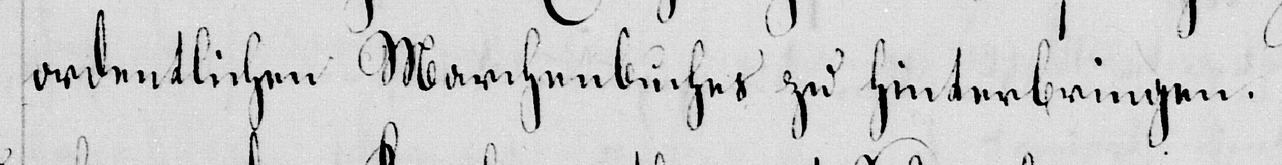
ordentlichen Marchenbuches zu hinterbringen.
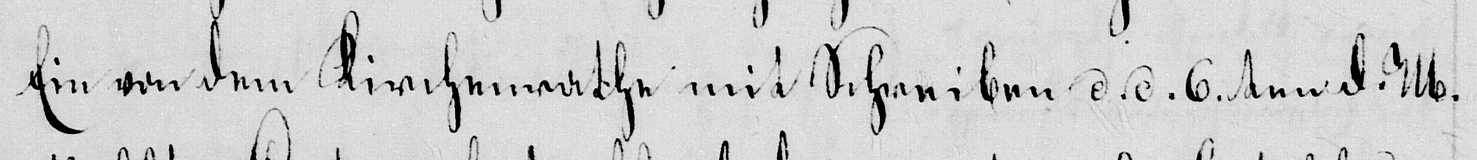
Ein von dem Kirchenrathe mit Schreiben d. d. 6.ten d. M.
